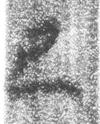也
